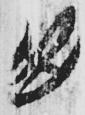臣
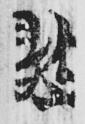敢
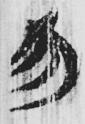勿
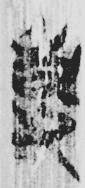事
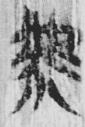{虍介}（乎）
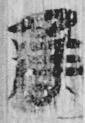唯（雖）
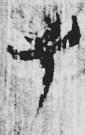父
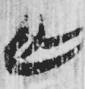亡（無）
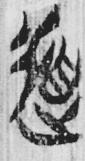道
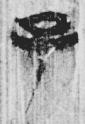子
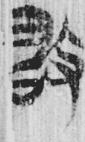敢
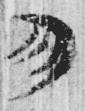勿
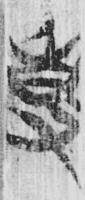事
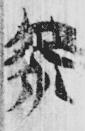{虍介}（乎）
